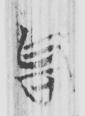{㠯ㅋ}
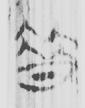昔
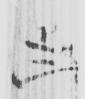之
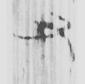又
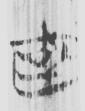國
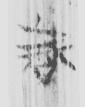者
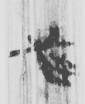必
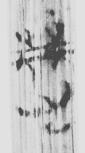{吅从心}
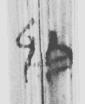於
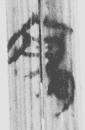宜
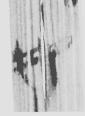母
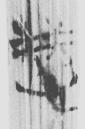{吅从心}
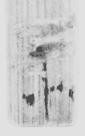{十七}
